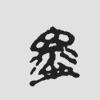墨
